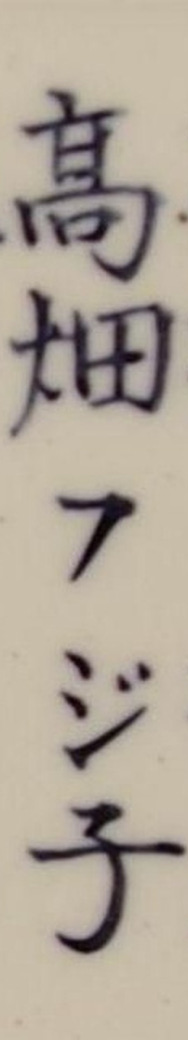高畑フジ子
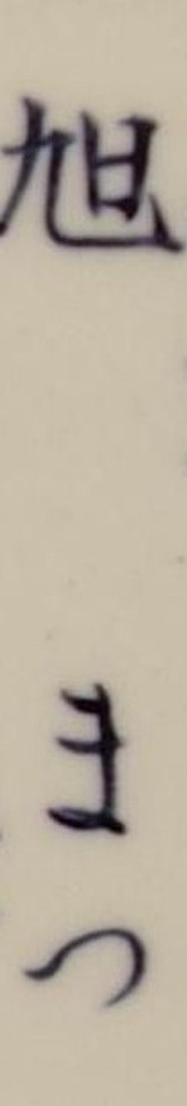旭まつ
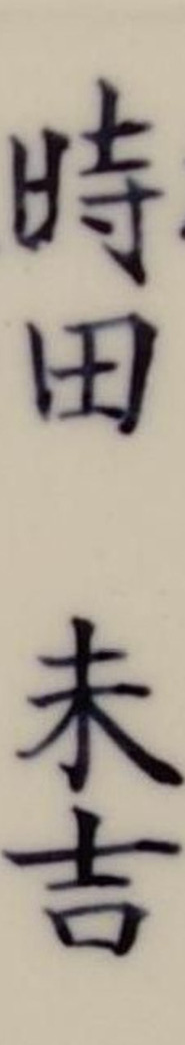時田未吉
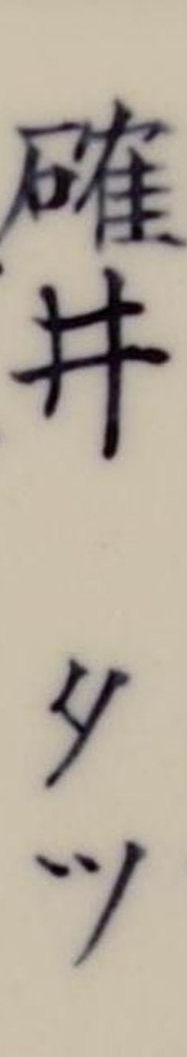碓井タツ
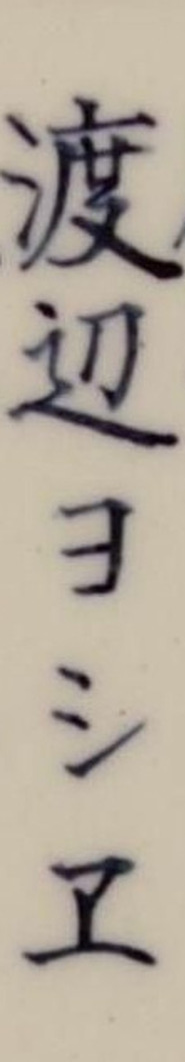渡辺ヨシヱ
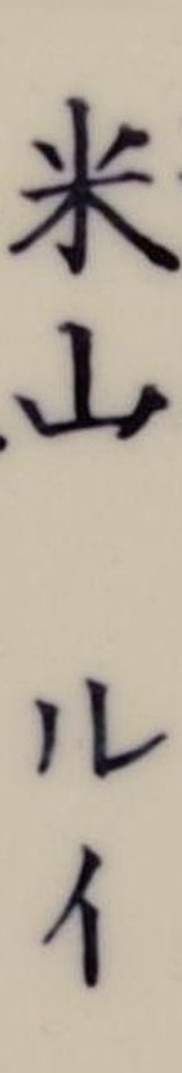米山ルイ
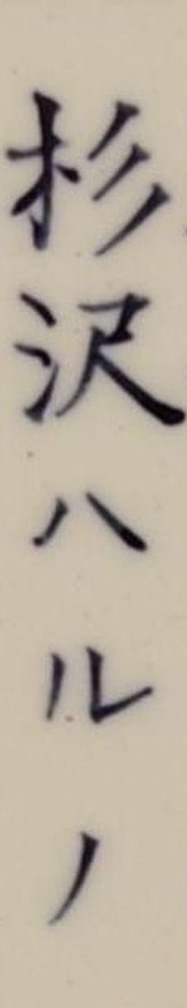杉沢ハルノ
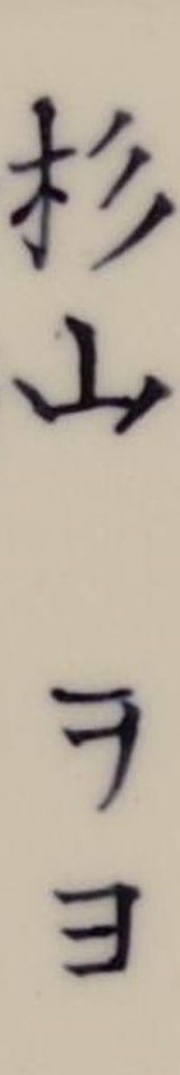杉山ヲヨ
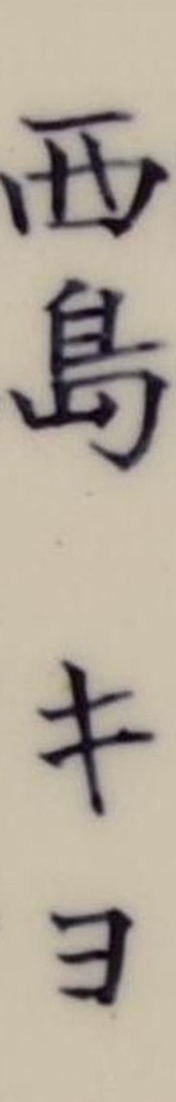西島キヨ
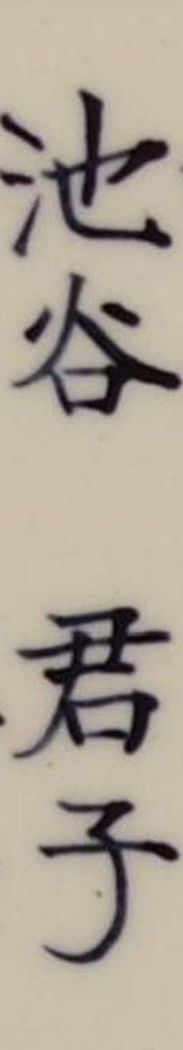池谷君子
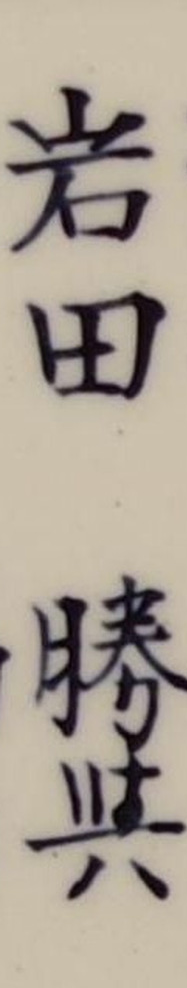岩田勝与
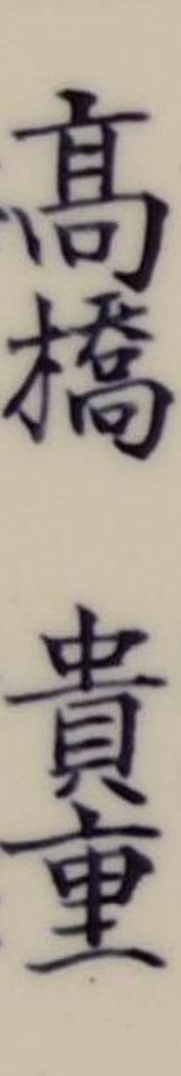高橋貴重
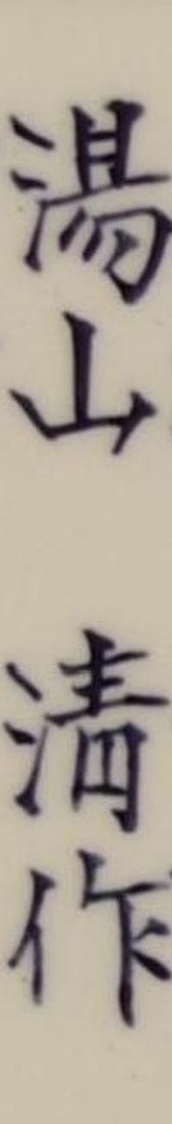湯山清作
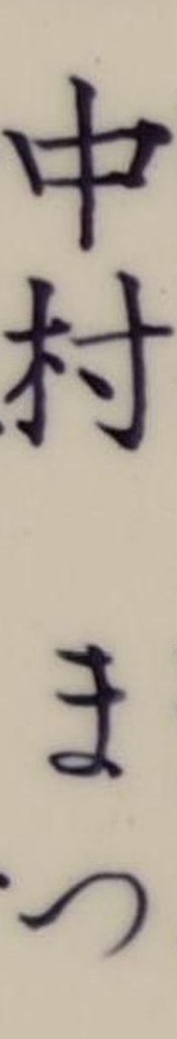中村まつ
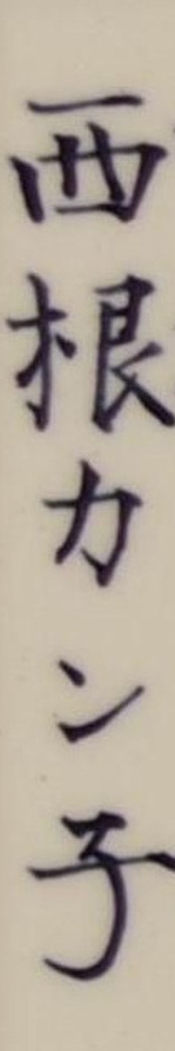西根カン子

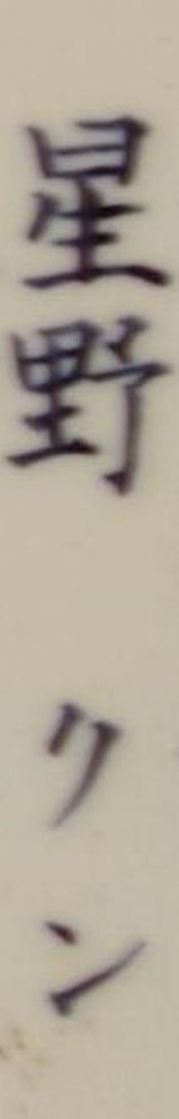星野クン
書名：E~L
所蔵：高野山金剛峯寺
